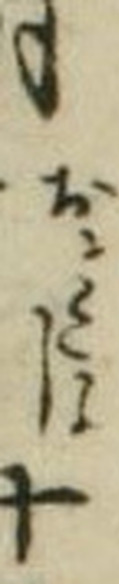おなし
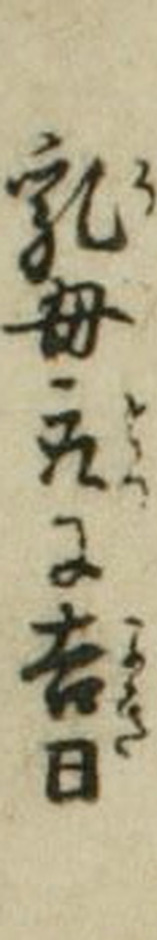乳母取に吉日
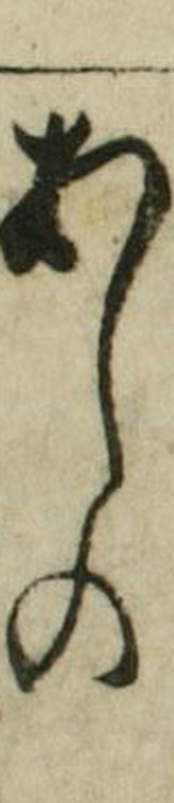あしの
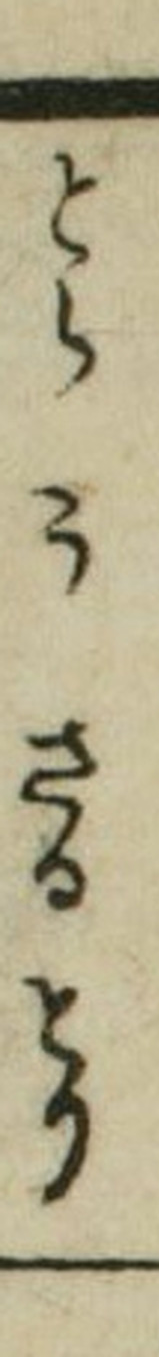とらうさるとり
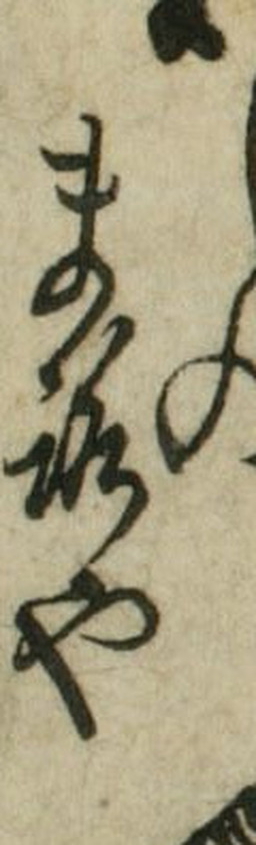まろや
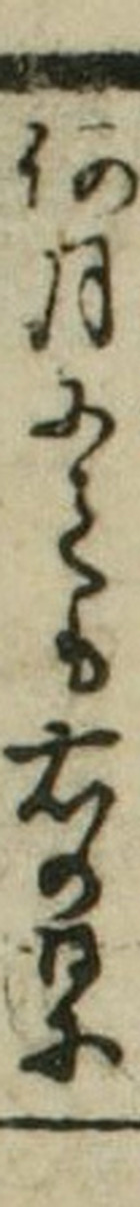何月にても右の日に
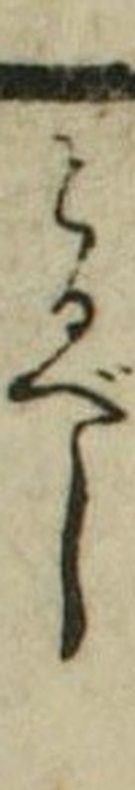とるべし
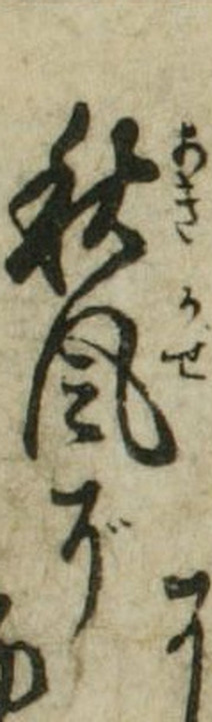秋風ぞ

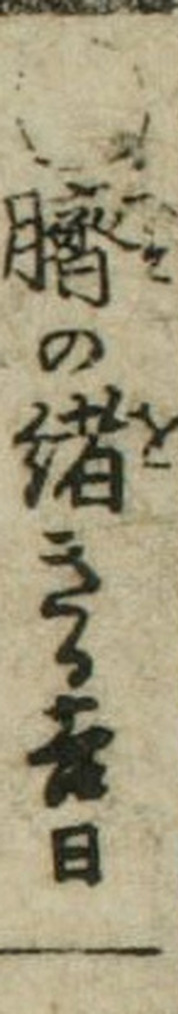○臍の緒きる吉日
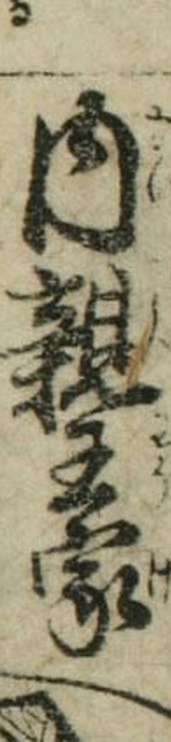内親王家
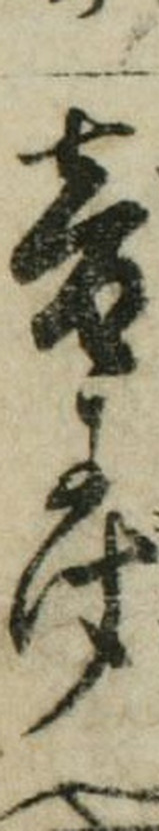音に聞
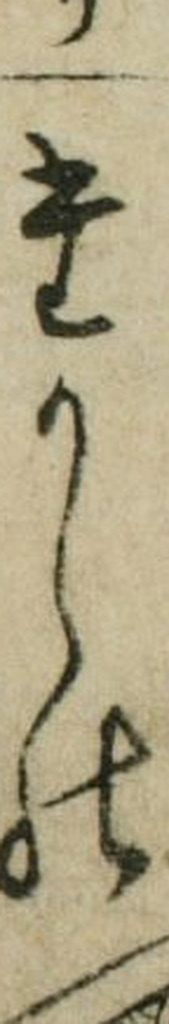たかしの
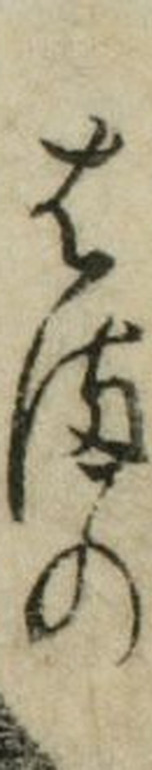はまの
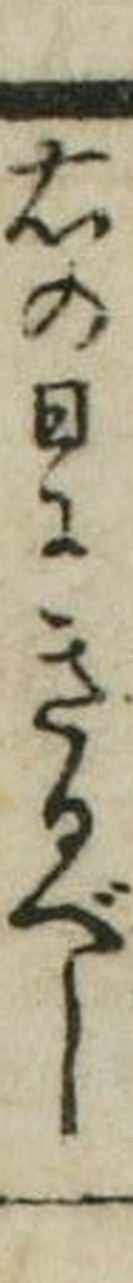右の日にきるべし
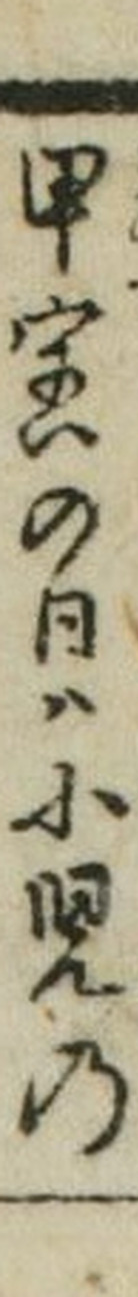甲寅の日は小児の
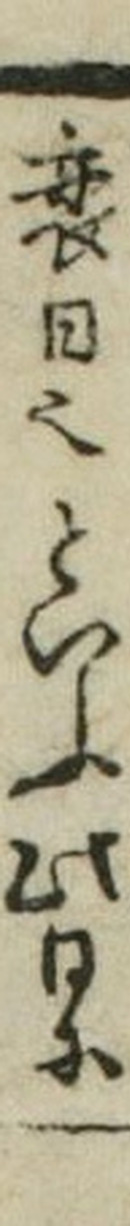衰日也といふ此日に
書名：百人一首
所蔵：東京学芸大学教育コンテンツアーカイブ
